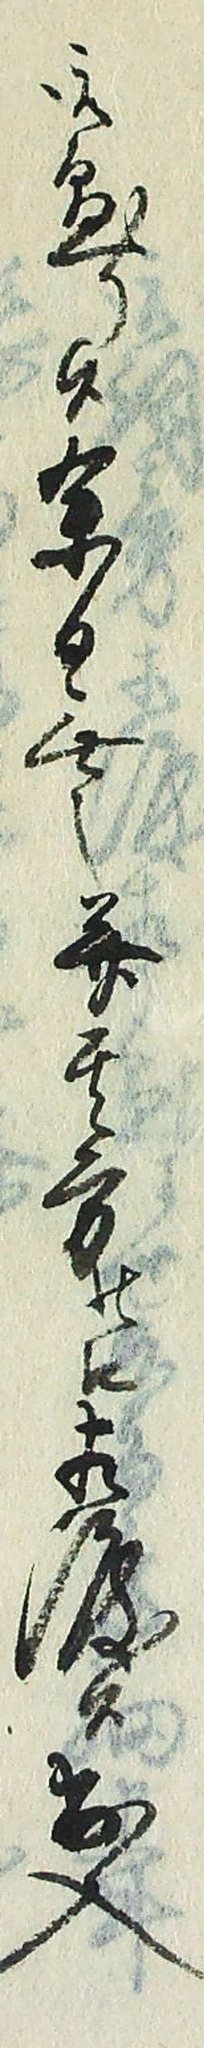取懸り候余日無之幷其方共江相渡候出入
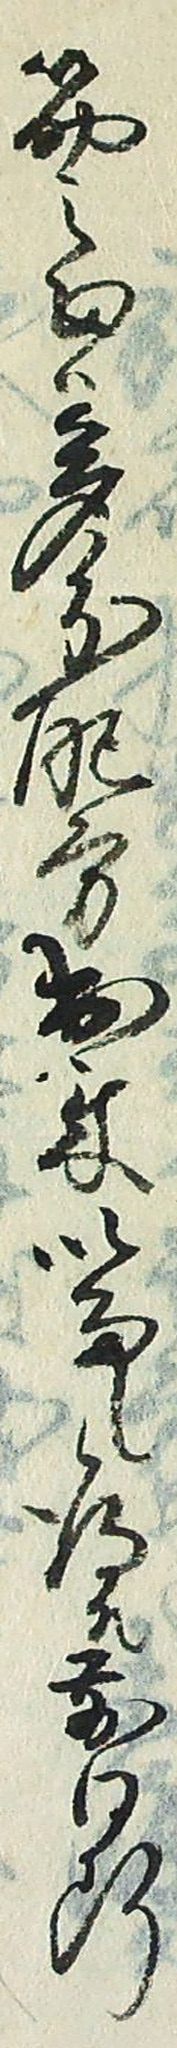筋之義ハ多分配方出来いたし候得共前同断
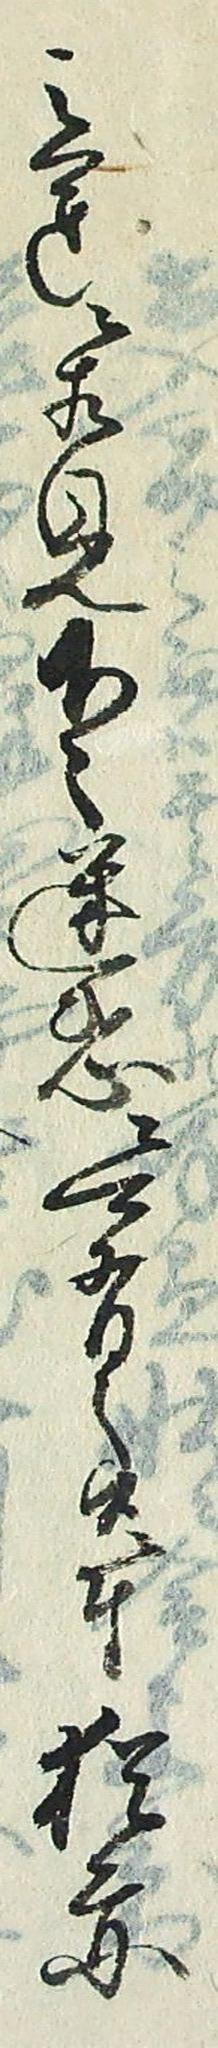之運ニ相見下々迷惑ニ可有之候ニ付猶亦
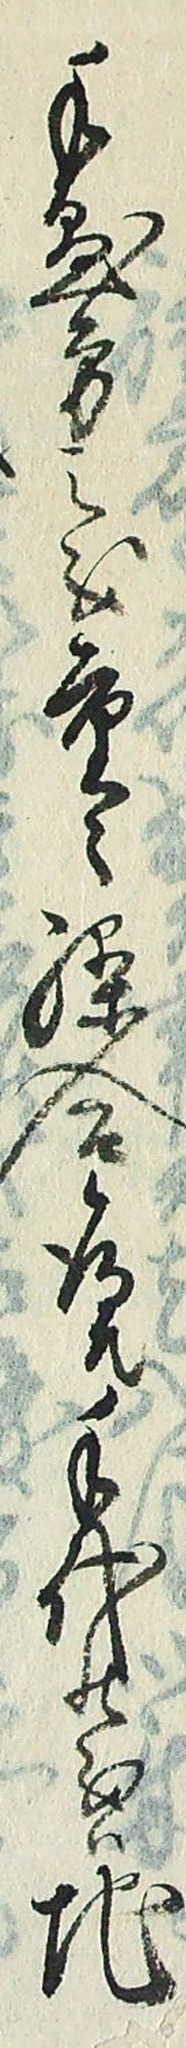手懸方之義重々繰合候得共手代共義ハ地
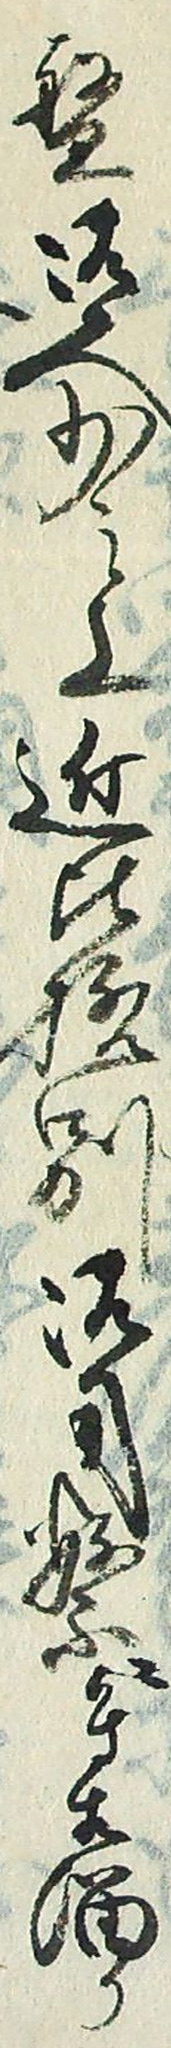盤御人少之上近比格別御用繁ニ付相溜り
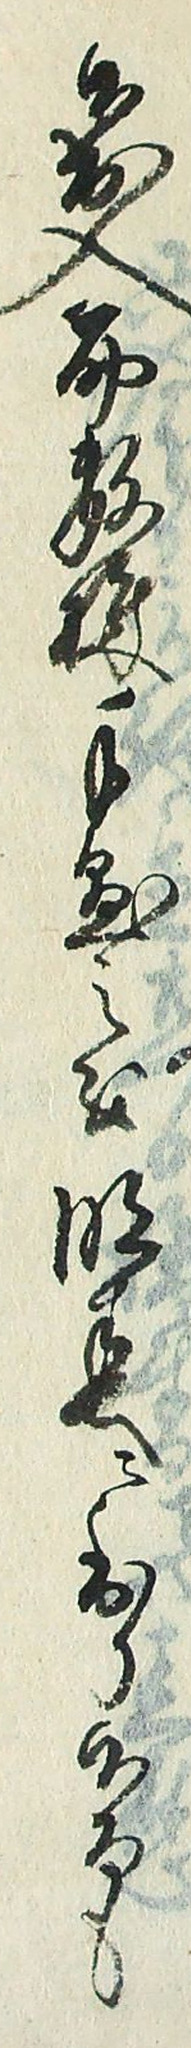候出入筋数株手懸之義明春ニ至り候而も

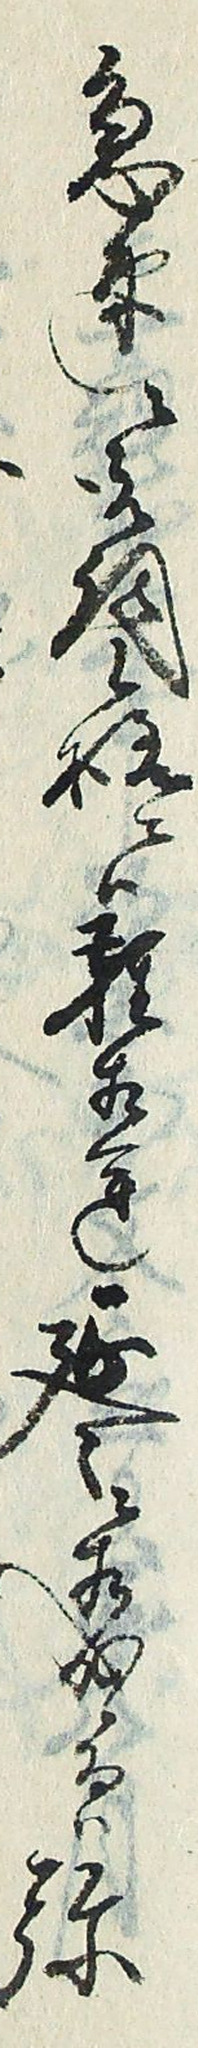急速ニ取調候様ニハ難相運延々ニ相成候而ハ弥
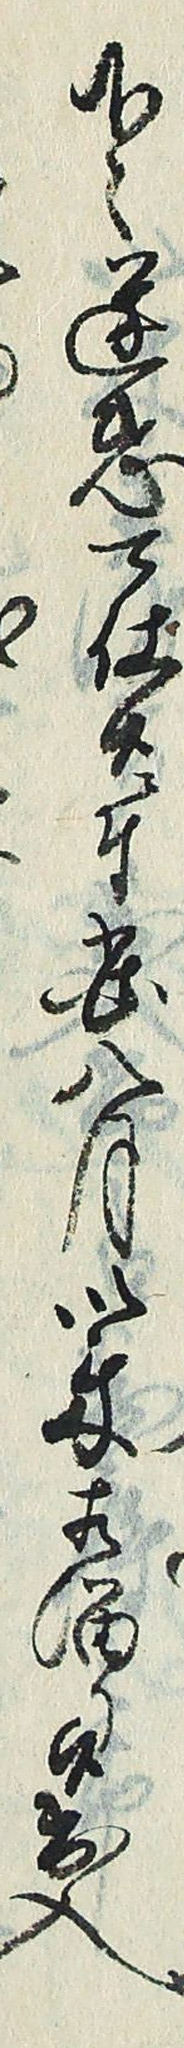下々迷惑可仕候ニ付當八月以来相溜り候出入
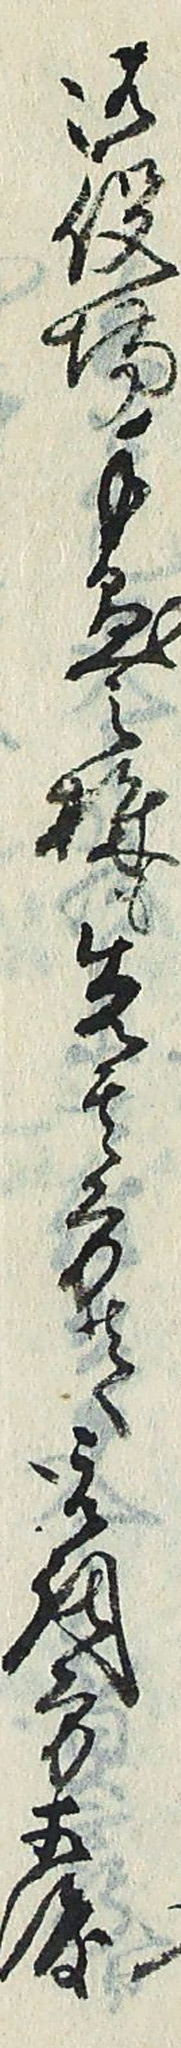御役場手懸之株も先其方共へ取調方相渡
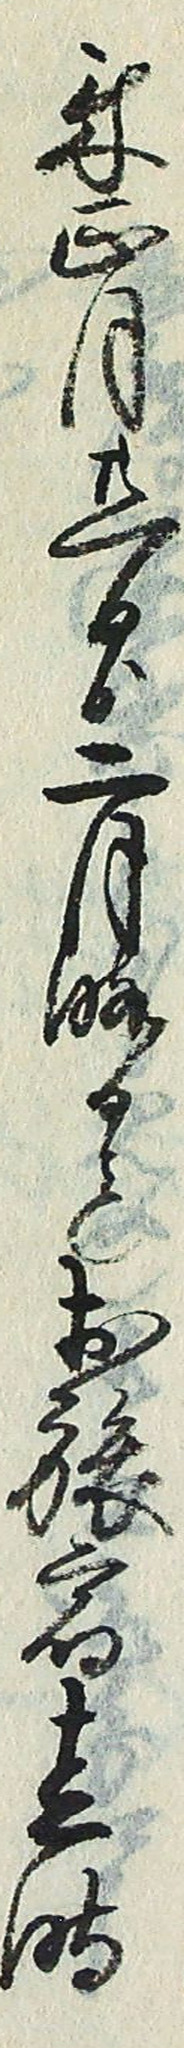来正月廿一日ゟ二月晦日迄於旅宿壱時
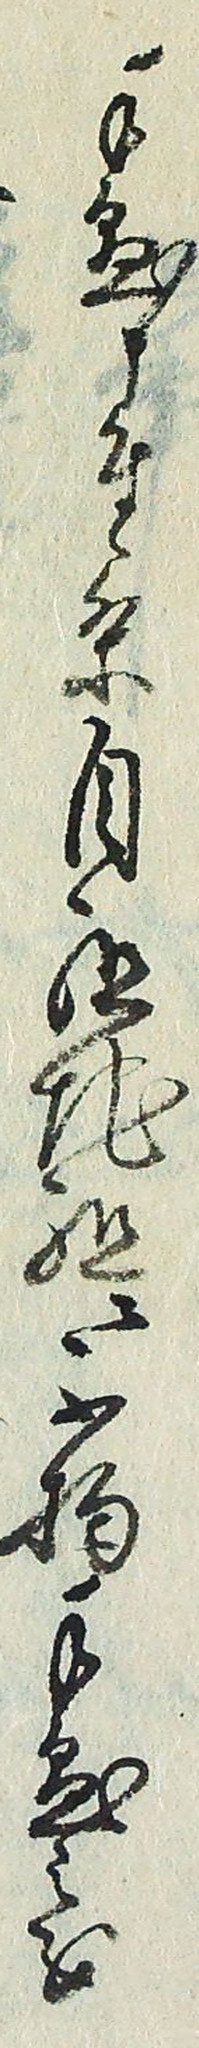手懸申付候条自組他組ニ不拘手懸之義
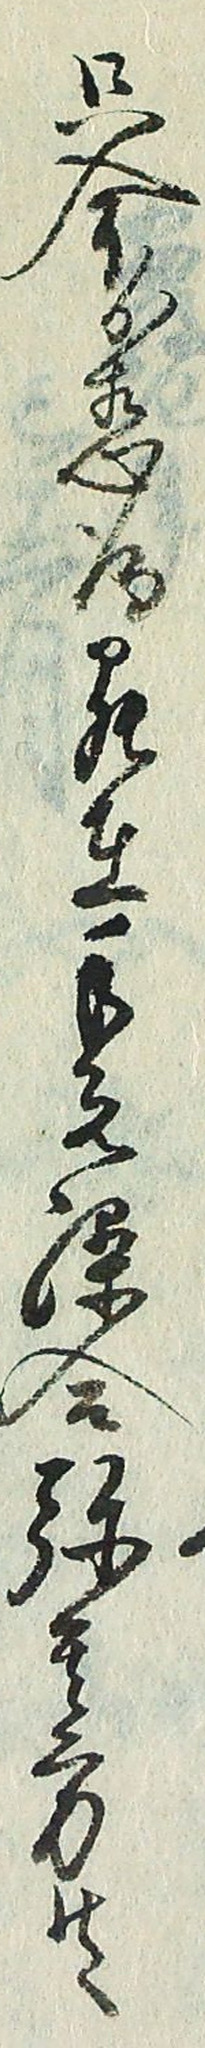只今ゟ相心得罷在手元繰合弥其方共へ
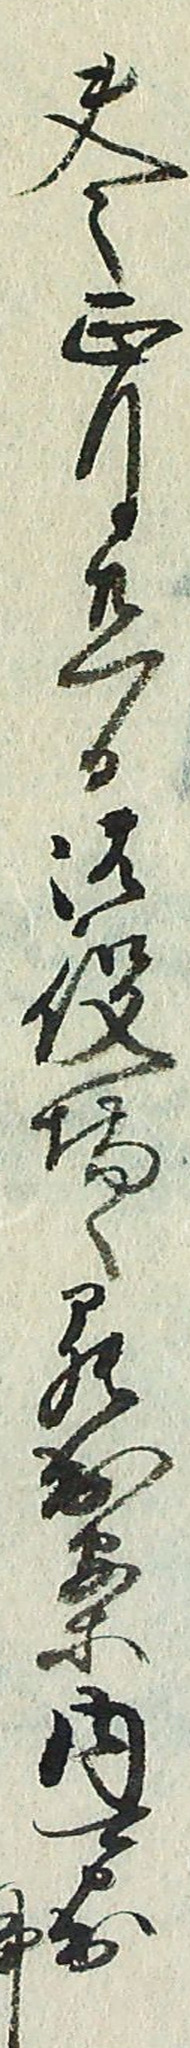夫々正月廿一日御役場へ罷出案内可申出事
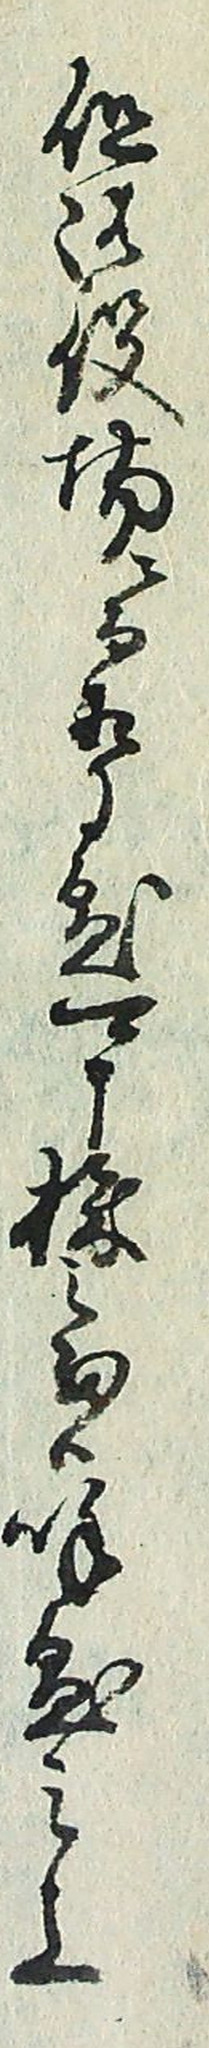但御役場ニ而相手懸可申株之義ハ呼懸之上
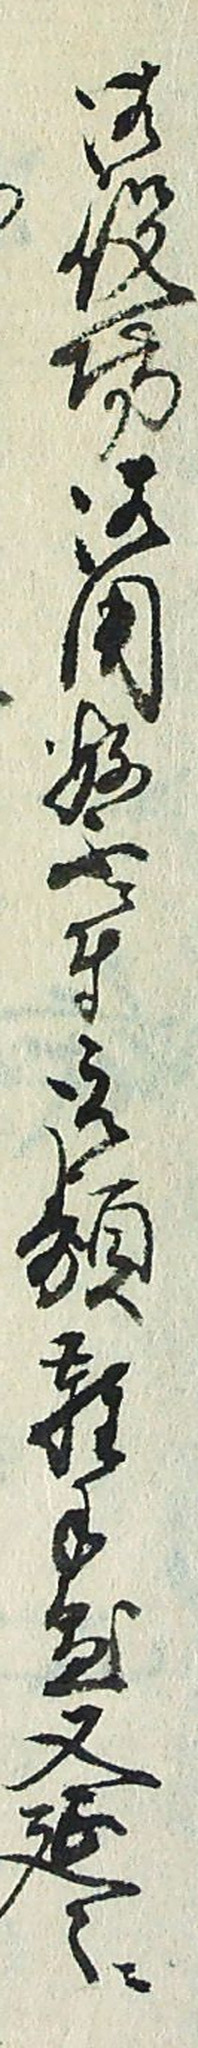御役場御用繁ニ付取頻難手懸又延々ニ
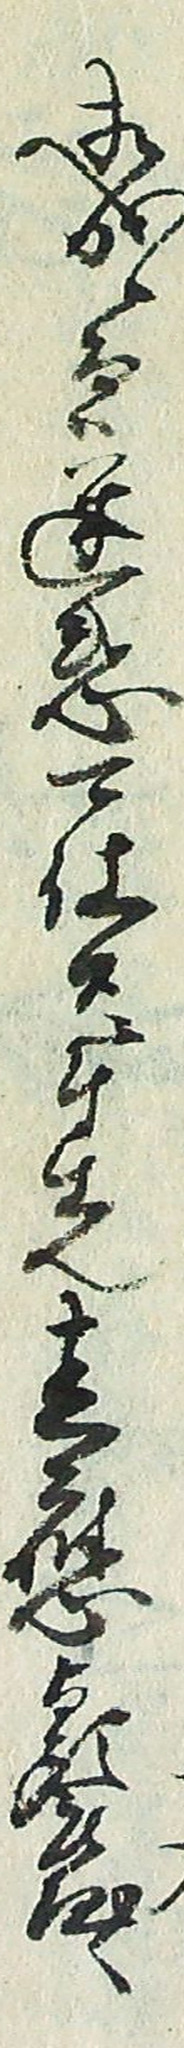相成候而ハ迷惑可仕候ニ付先壱應与頭庄屋へ
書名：諸御趣意書并御下知向之写
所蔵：鳴門教育大学 Naruto University of Education
